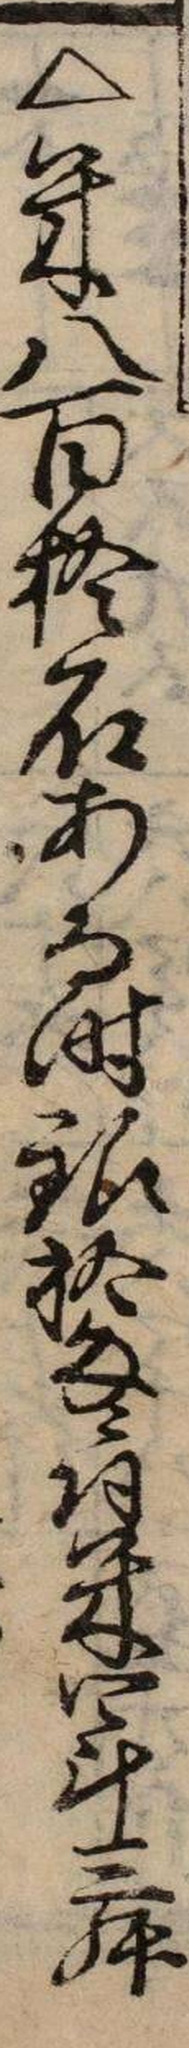△米八百拾石ある時銀拾匁に付米四斗三升
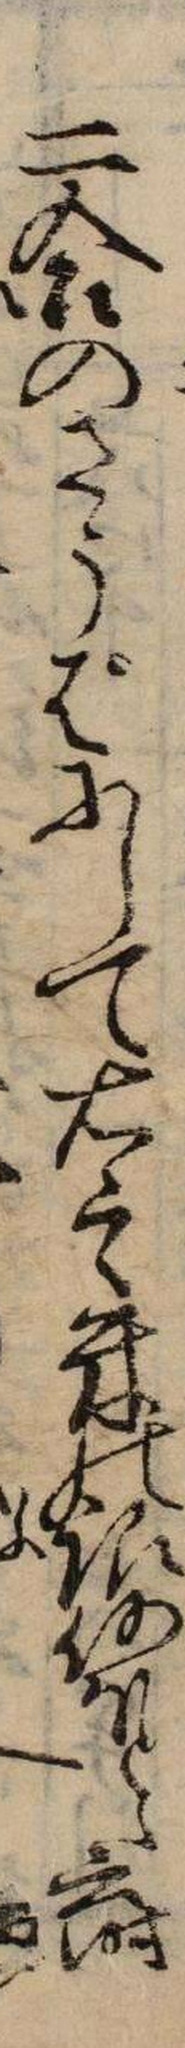二合のさうばにして右之米の銀何ほとと云時
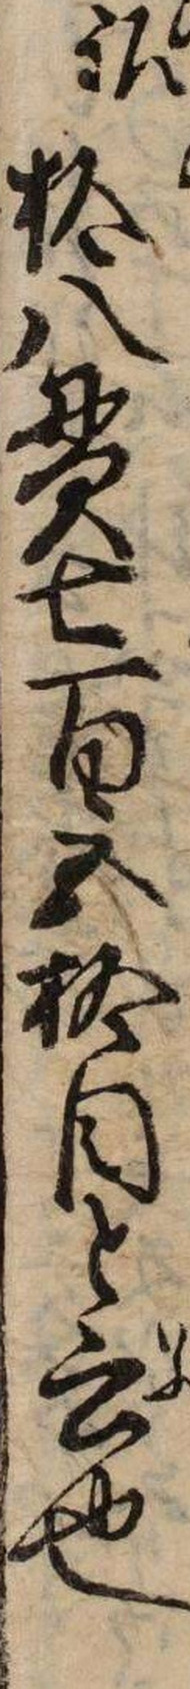弐拾八貫七百五拾目と云也
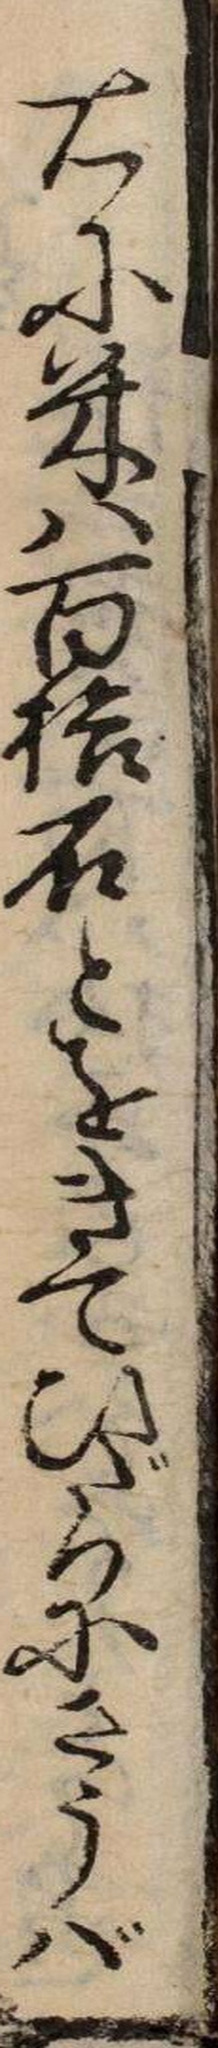右に米八百拾石とをきてひだるにさうば
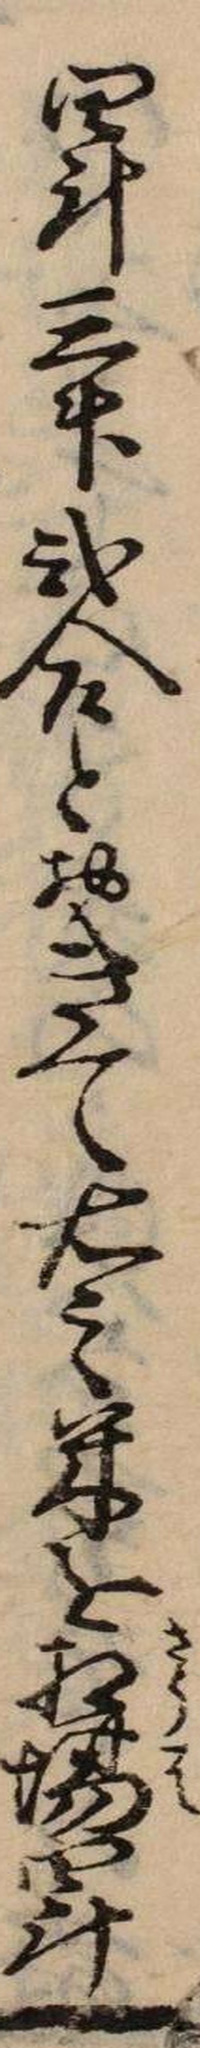四斗三升弐合とおきて右之米を相場四斗
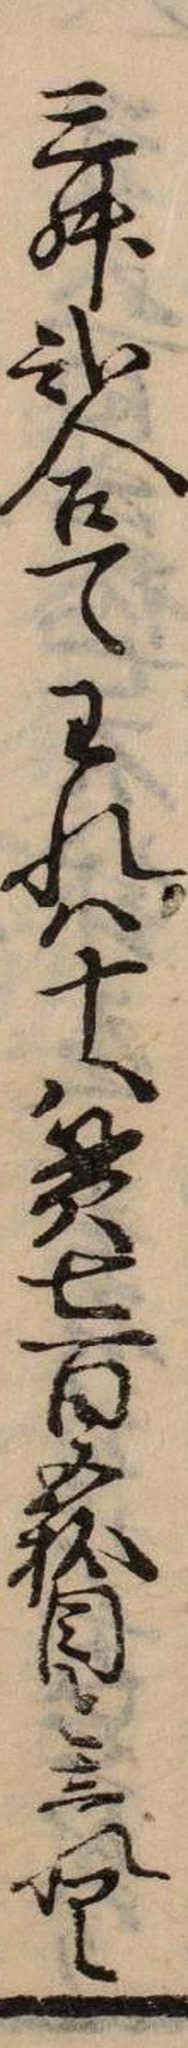三升弐合てわれは十八貫七百五拾目としれ申候
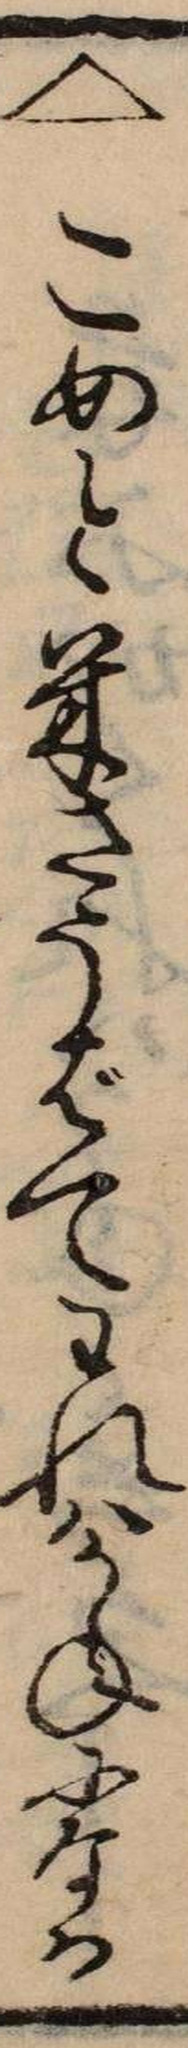△こめと米さうばてわれはかねになる
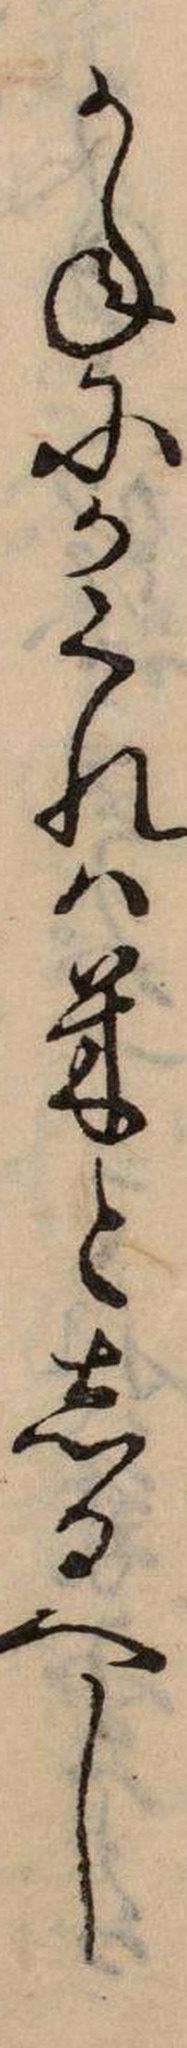かねにかくれは米としるへし
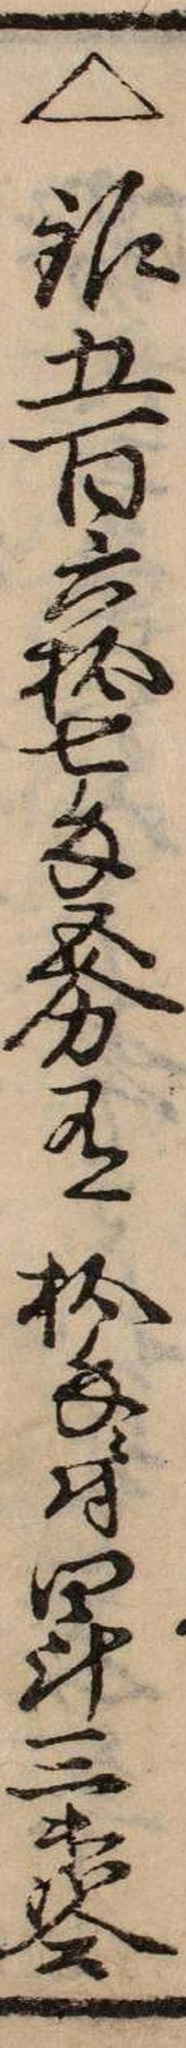△銀五百六拾七匁五分有拾匁付四斗三升弐合
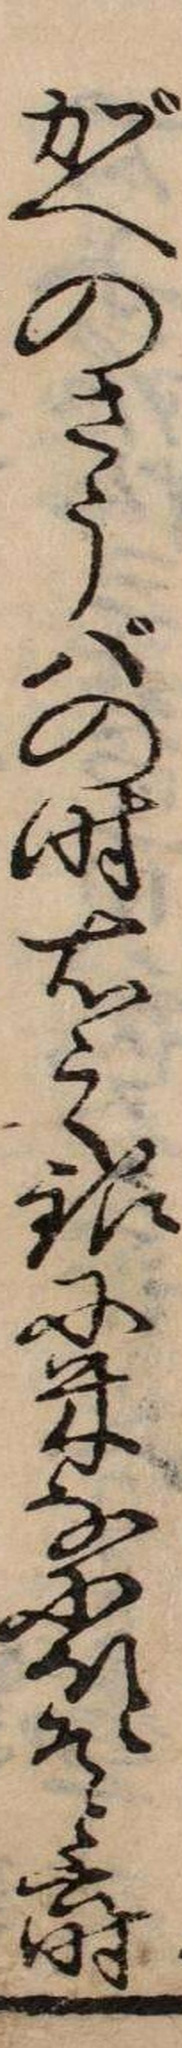がへのさうばの時右之銀に米なにほとそと云時
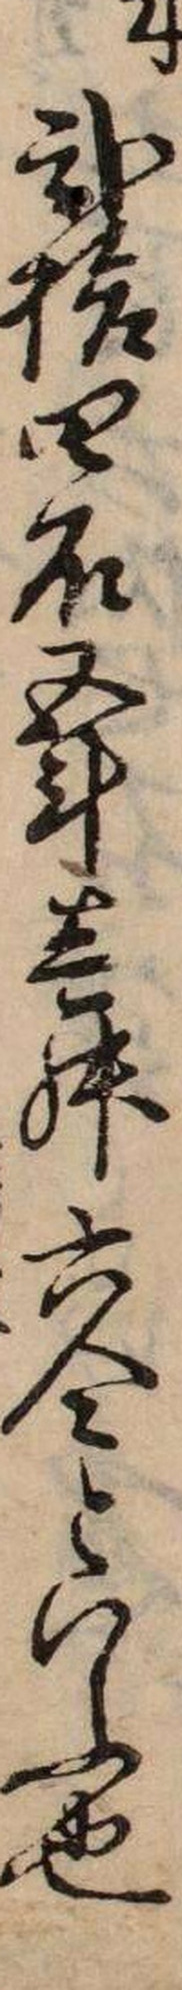米弐拾四石五斗壱升六合といふ也
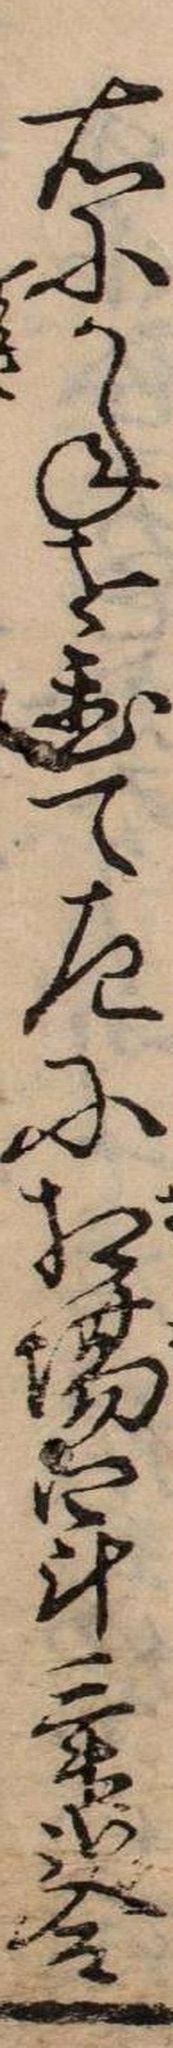右にかねを置て左に相場四斗三升弐合
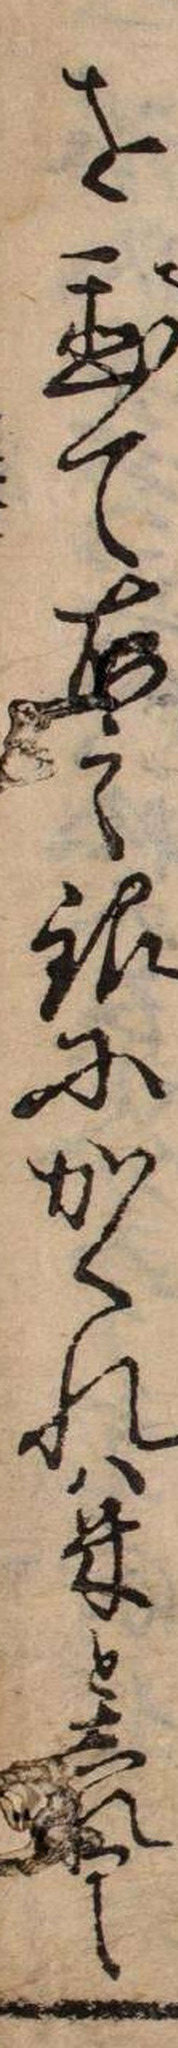を置て右之銀にかくれは米としれ申候

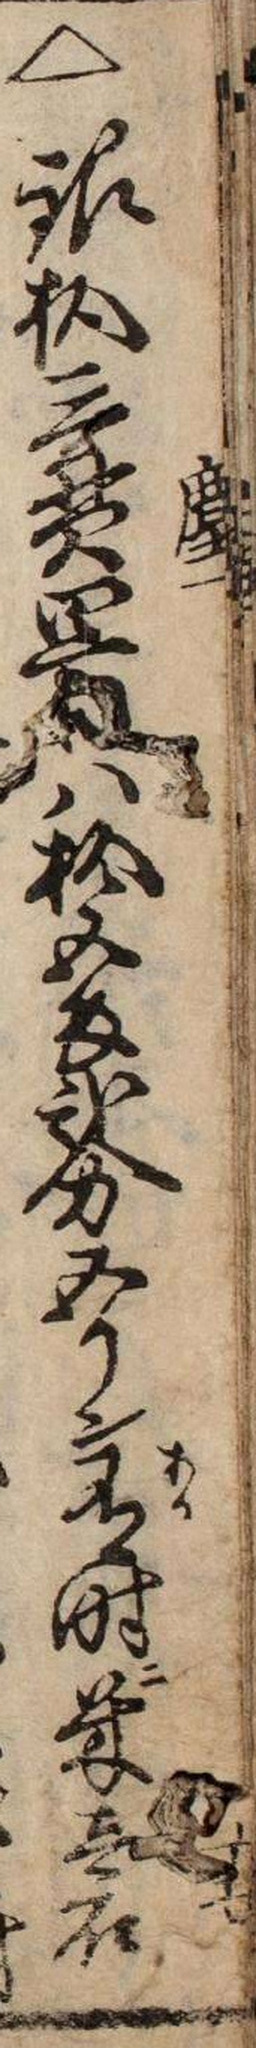△銀拾三貫四百八拾五匁弐分五りん有時に壱石
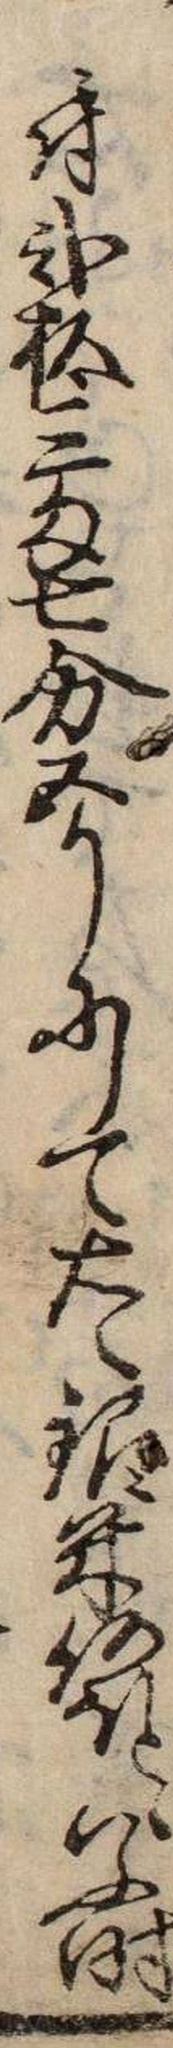に付弐拾三匁七分五厘にして右の銀に米何ほとゝいふ時
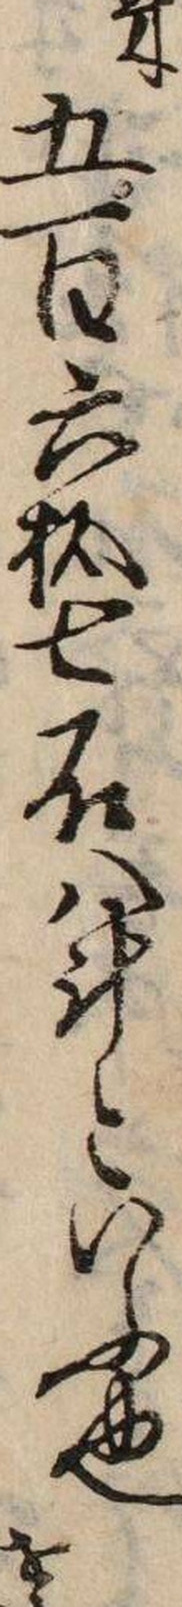米五百六拾七石八斗といふ也
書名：塵劫記（寛永11年自跋、京都府立京都学・歴彩館追貴8）
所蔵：京都府立京都学・歴彩館 国文学研究資料館
